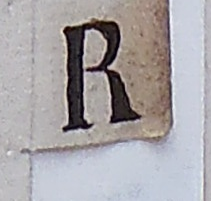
R
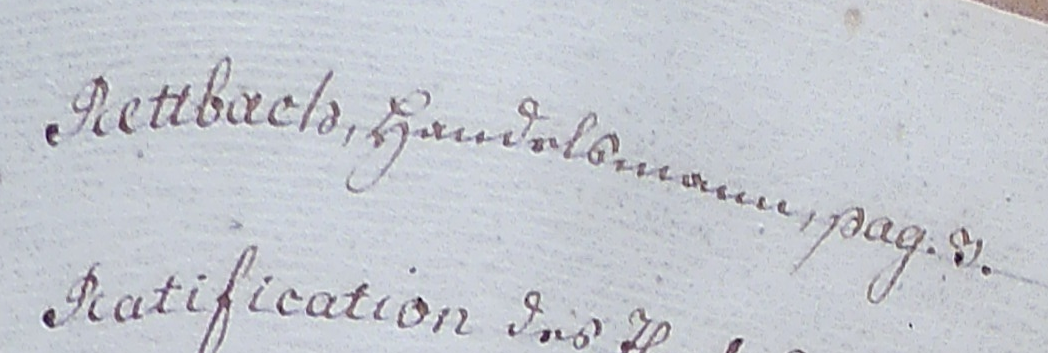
Rettbach, Handelsmann, pag. 3.
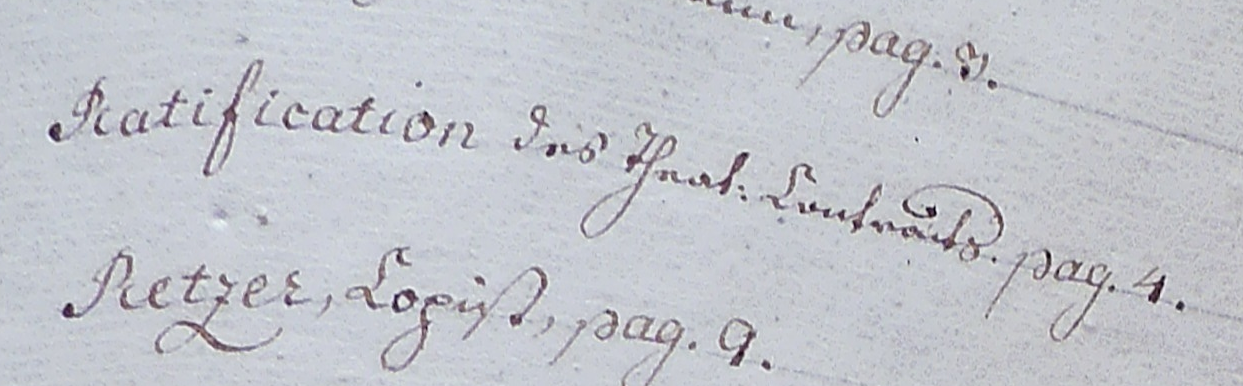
Ratificaton des Theat: Contracts. pag 4.
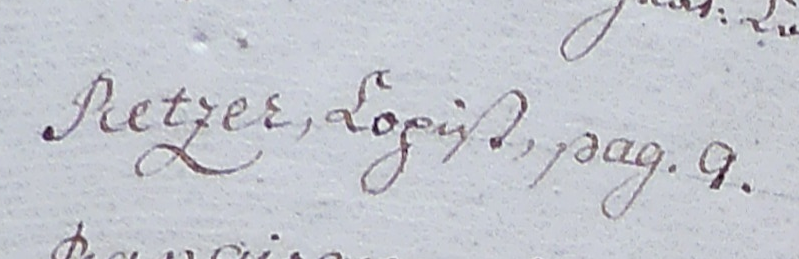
Retzer, Copist, pag. 9.
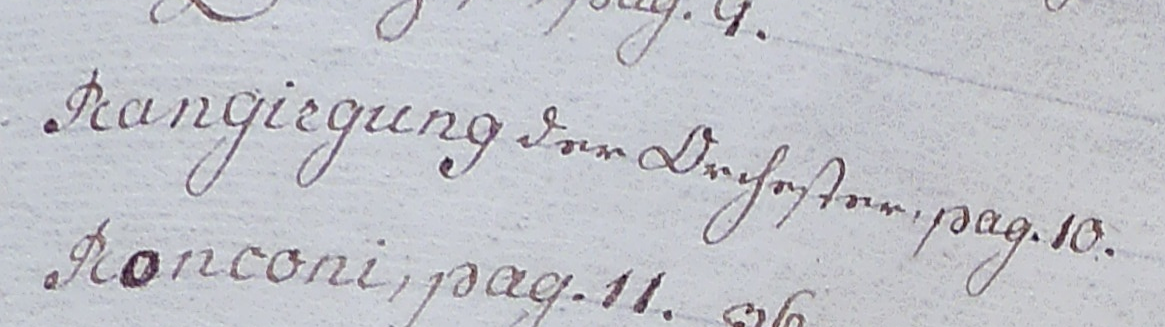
Rangirgung der Orchester, pag. l0.
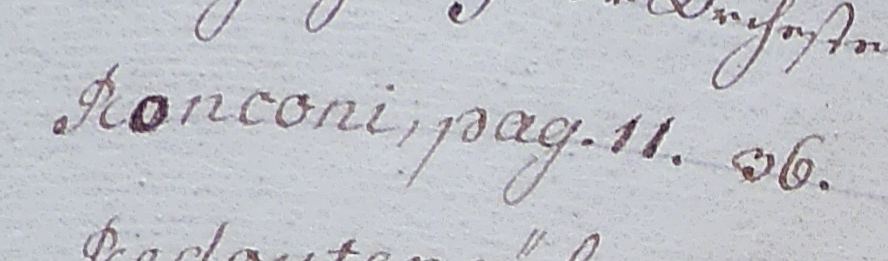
Ronconi, pag. 11. 36.
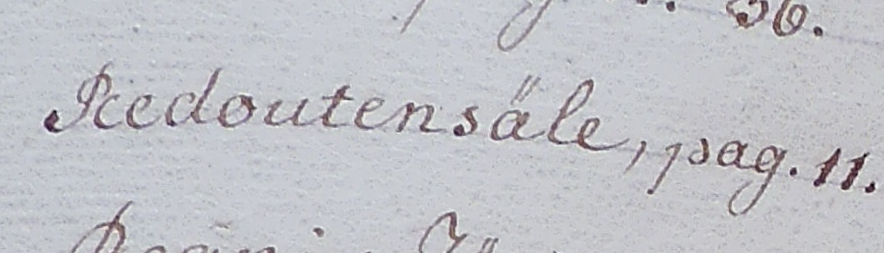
Redoutensäle, pag. 11.
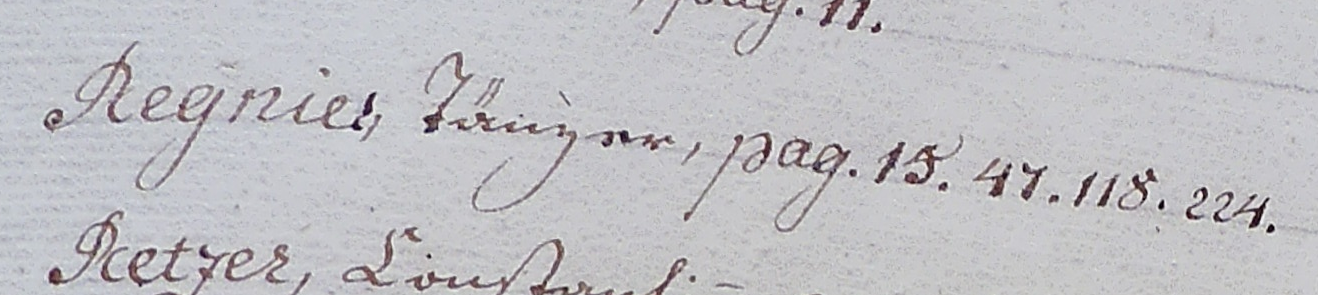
Regnier, Tänzer, pag. 15. 47. 118. 224.
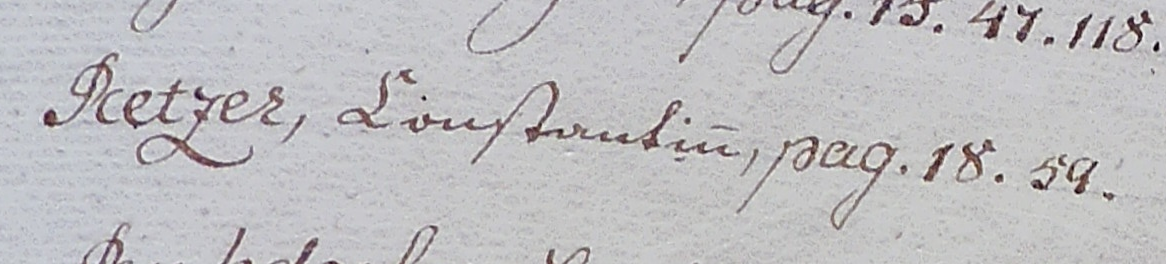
Retzer, Constantin̅, pag. 18. 59.
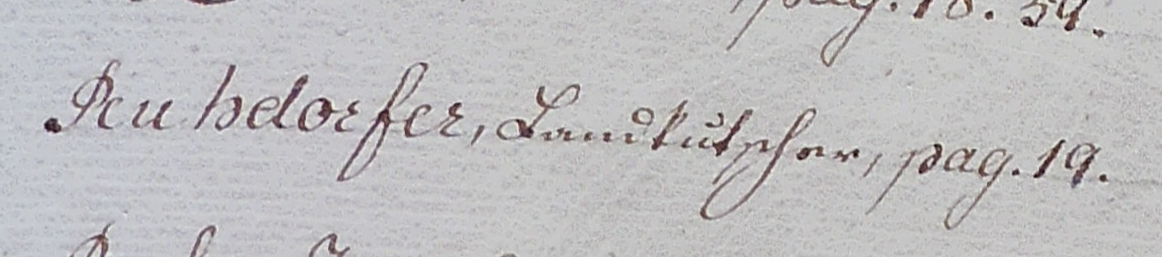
Ruhdorfer, Landkutscher, pag. 19.
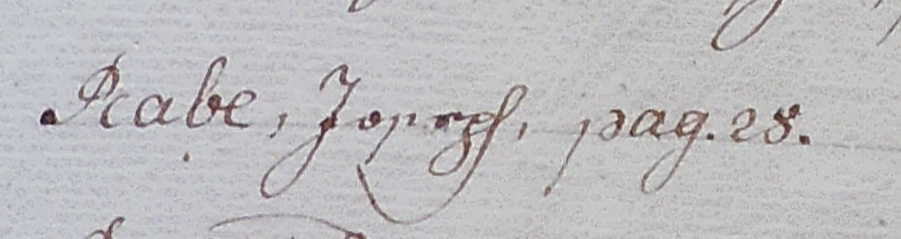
Rabe, Joseph, pag. 28.
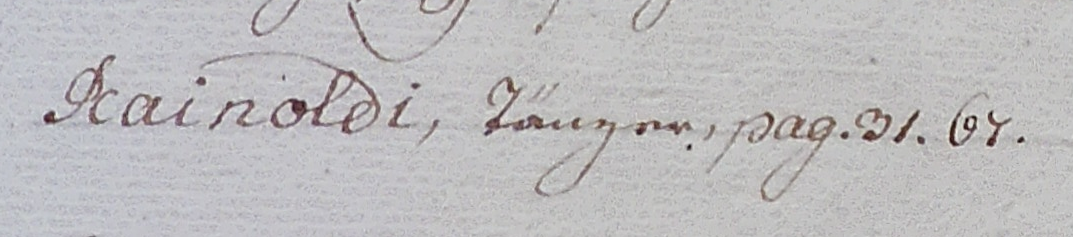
Rainoldi, Tänzer, pag. 31. 67.
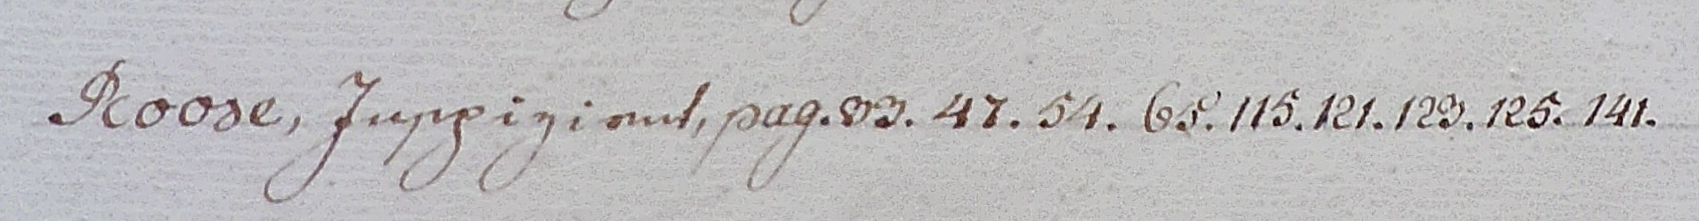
Roose, Inspizient, pag. 33. 47. 54. 65. 115. 121. 123. 125. 141.
